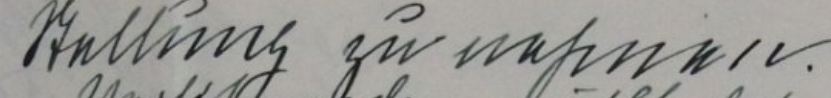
Stellung zu nehmen.
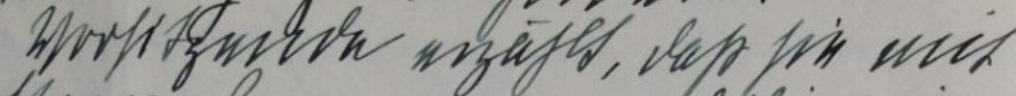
Vorsitzende erzöhlt, daß sie mit
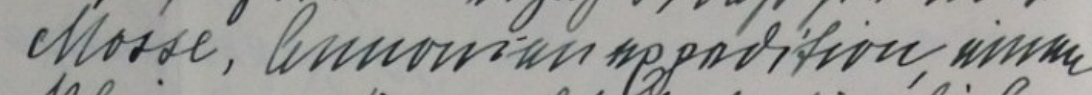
Masse, Annvian expedition einen
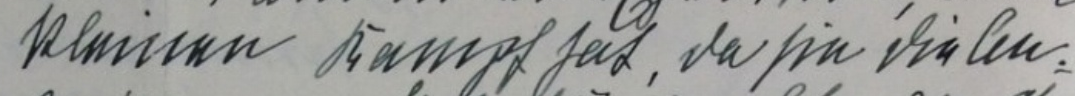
kleinen Kampf hatm da sie die An
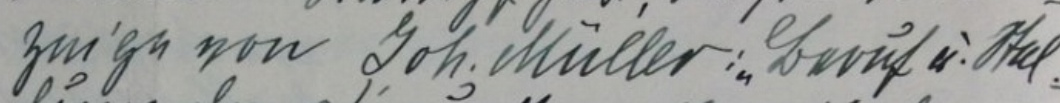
zeige von Joh. Müller:„Beruf und Stel
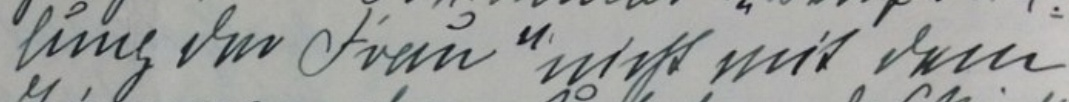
lung der Frau" nicht mit dem
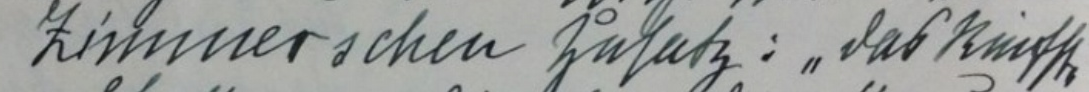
Zimmerschen Zusatz:„das Reichste
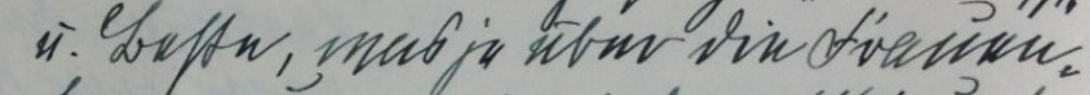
u Beste was je über die Frauen
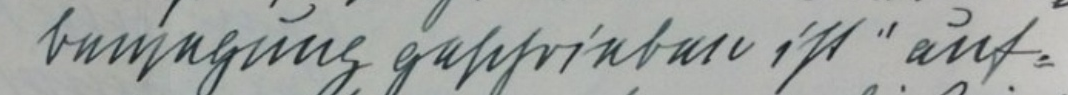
bewegung geschrieben ist" auf
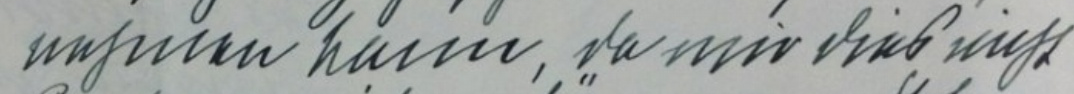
nehmen kann, da mir dies nicht
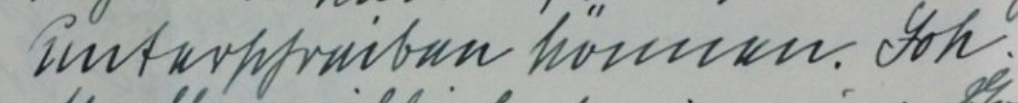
unterschreiben können. Joh.
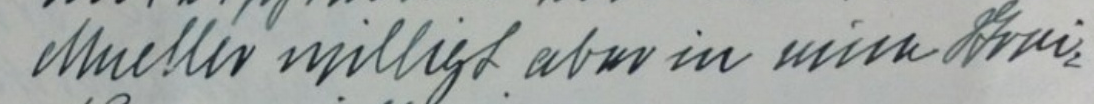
Mueller willigt aber in eine Strei
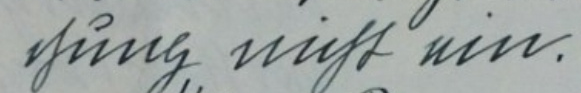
chung nicht ein.
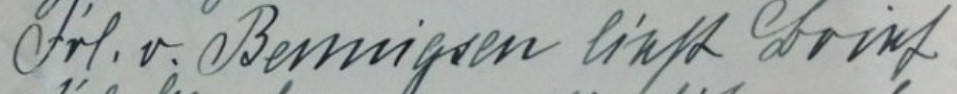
Frl. von Bennigsen leist Brief
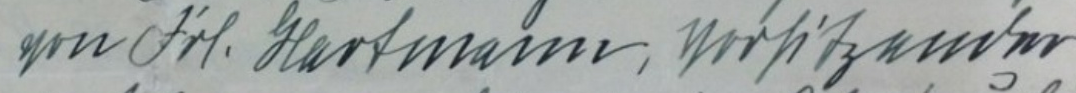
von Frl. Hartmann, Vorsitzender
